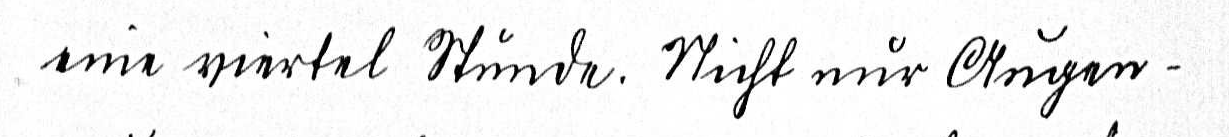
eine viertel Stunde. Nicht nur Augen¬
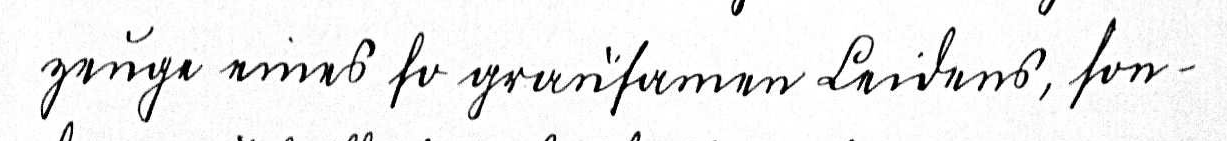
zeuge eines so grausamen Leidens, son¬
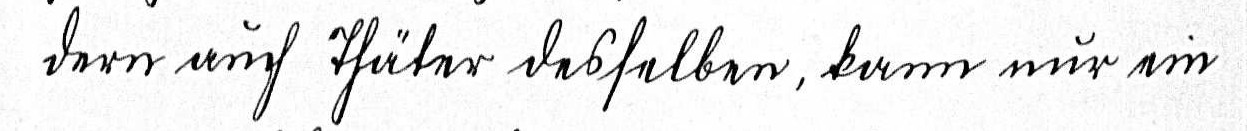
dern auch Thäter desselben, kann nur ein
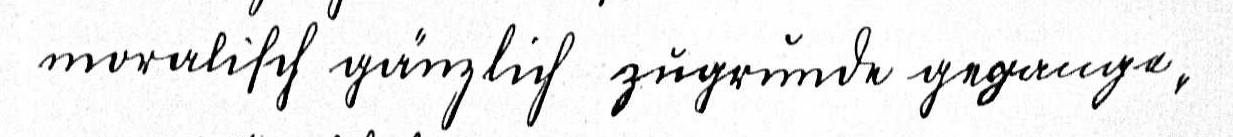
moralisch gänzlich zugrunde gegange¬
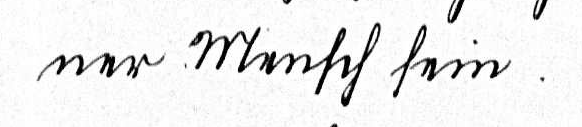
ner Mensch sein.
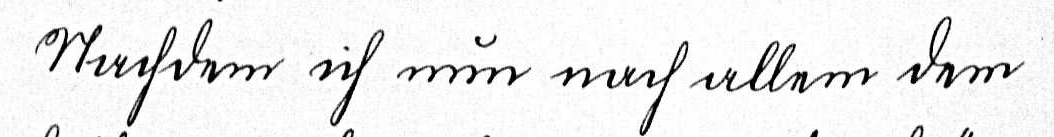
Nachdem ich nun nach allem dem
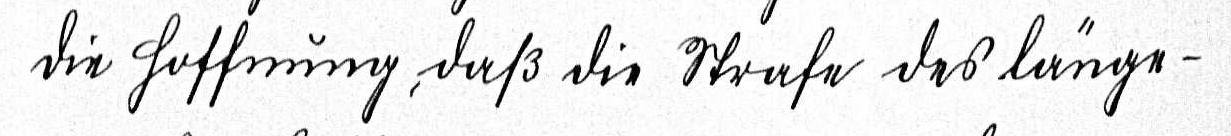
die Hoffnung, daß die Strafe des länge¬
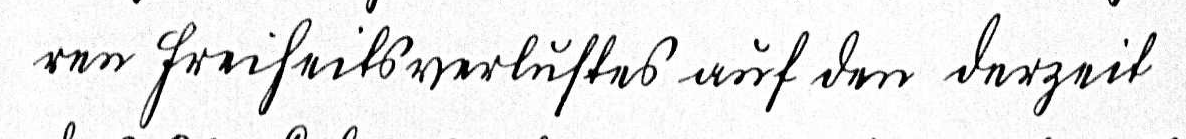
ren Freiheitsverlustes auf den derzeit
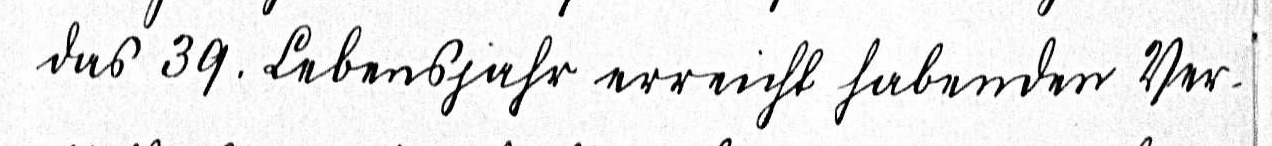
das 39. Lebensjahr erreicht habenden Ver¬
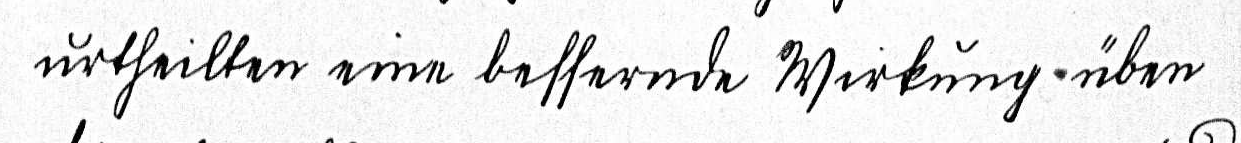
urtheilten eine bessernde Wirkung üben
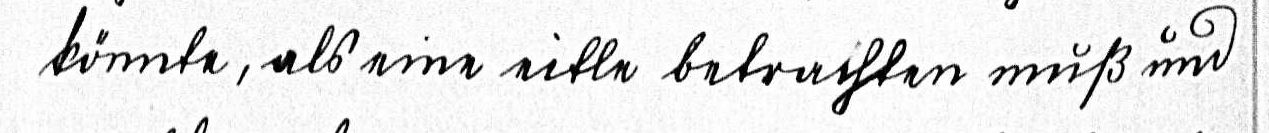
könnte, als eine eitle betrachten muß und
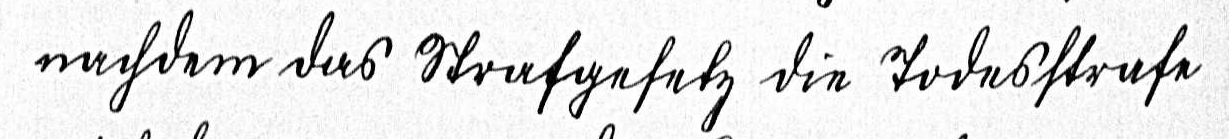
nachdem das Strafgesetz die Todesstrafe
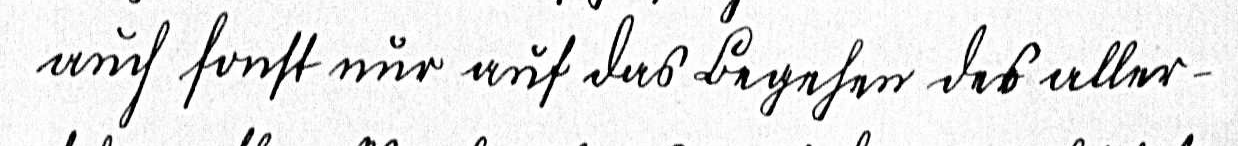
auch sonst nur auf das Begehen des aller¬
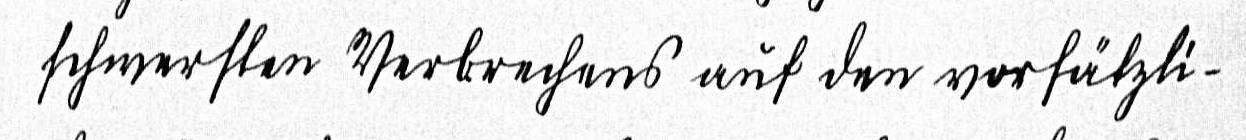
schwersten Verbrechens auf den vorsätzli¬
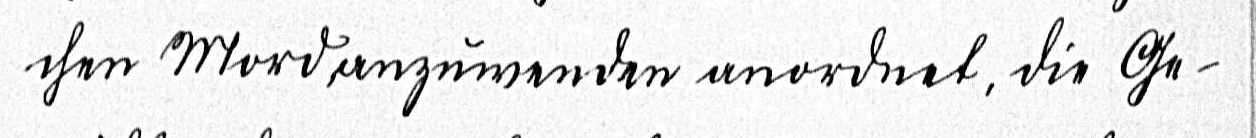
chen Mord anzuwenden anordnet, die Ge¬
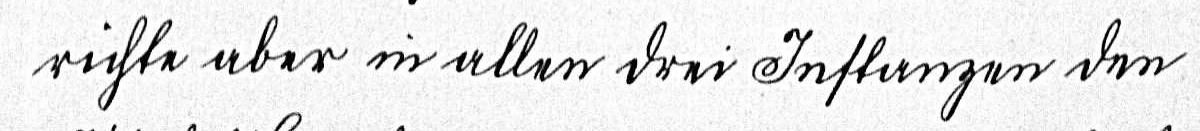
richte aber in allen drei Instanzen den
